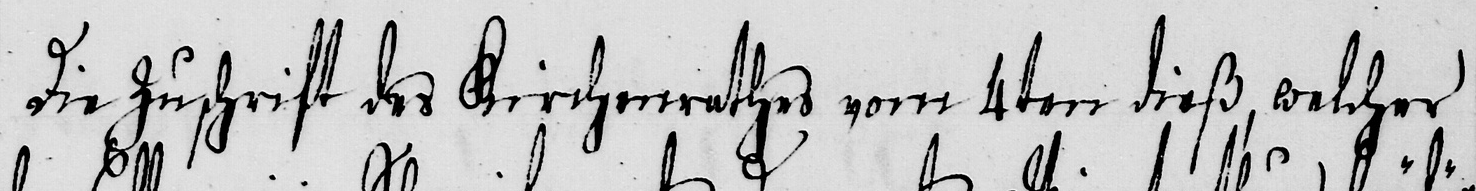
Die Zuschrift des Kirchenrathes vom 4ten dieß, welcher
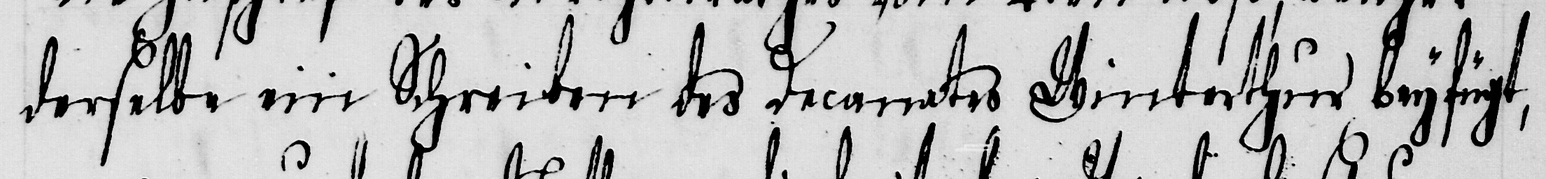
derselbe ein Schreiben des Decanates Winterthur beyfügt,
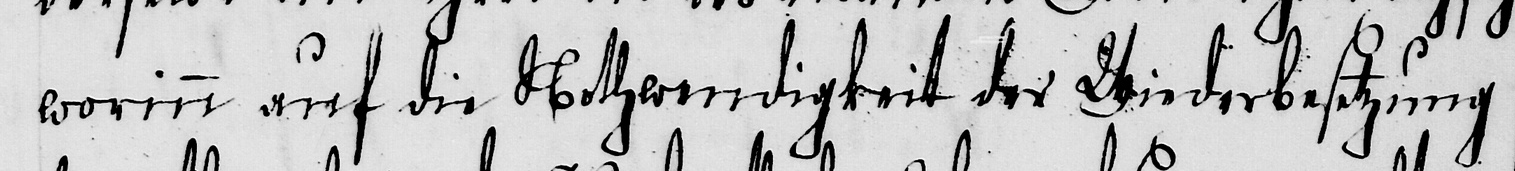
worin auf die Nothwendigkeit der Wiederbesetzung
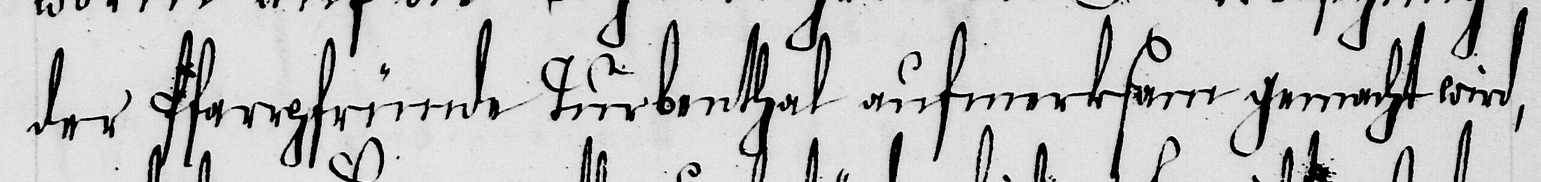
der Pfarrpfründe Turbenthal aufmerksam gemacht wird,
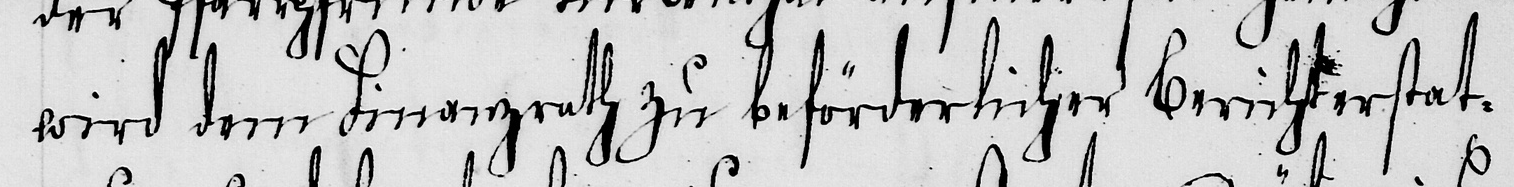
wird dem Finanzrath zu beförderlicher Berichterstat¬
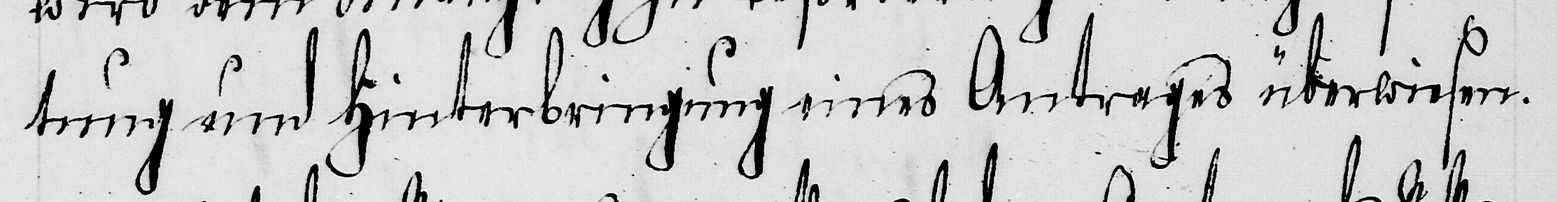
tung und Hinterbringung eines Antrages überwiesen.
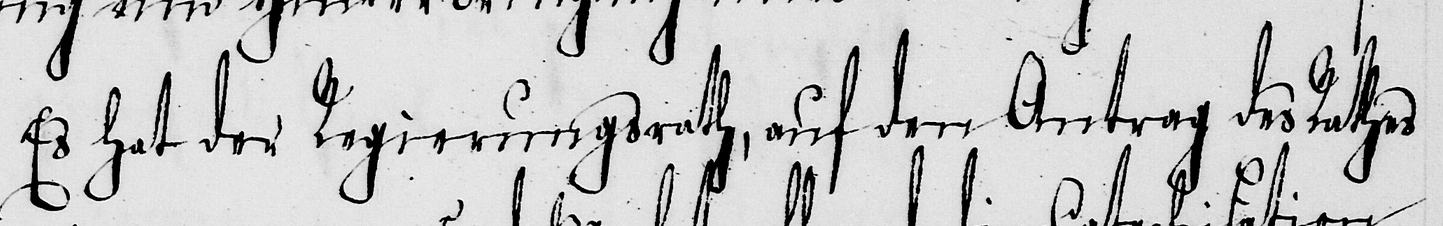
Es hat der Regierungsrath, auf den Antrag des Rath¬
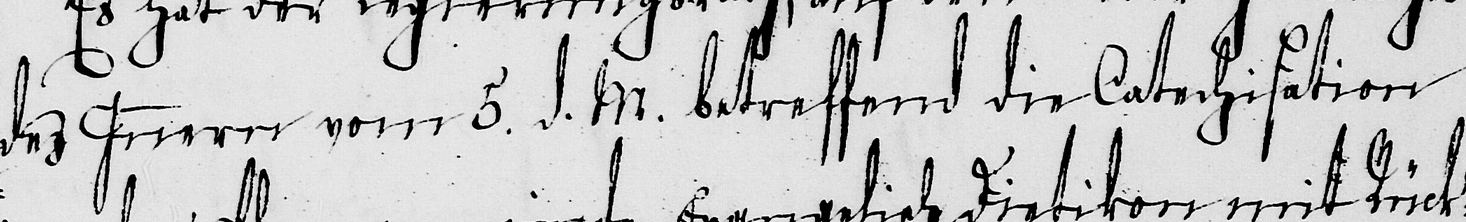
es Innern vom 5. d. M. betreffend die Catechisation
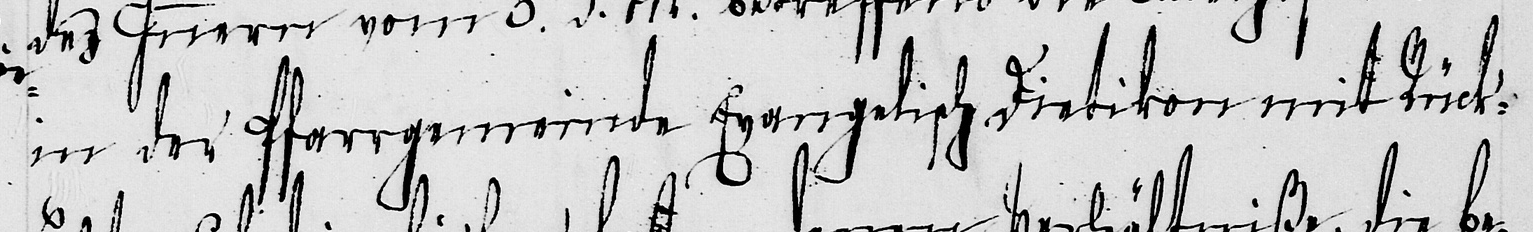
in der Pfarrgemeinde Evangelisch Dietikon mit Rück¬
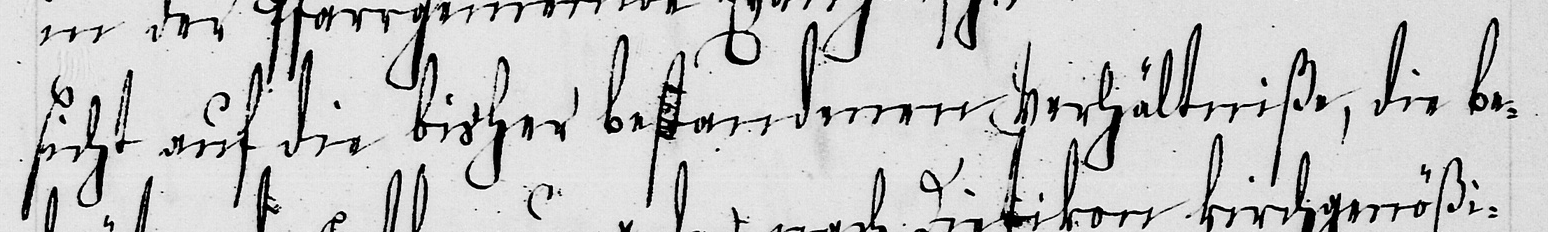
sicht auf die bisher bestandenen Verhältniße, die be¬
